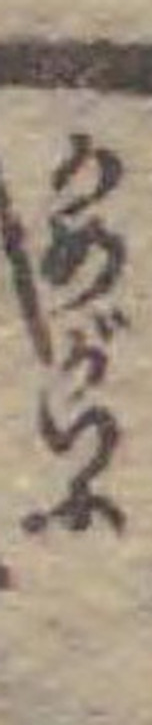かめがいふ
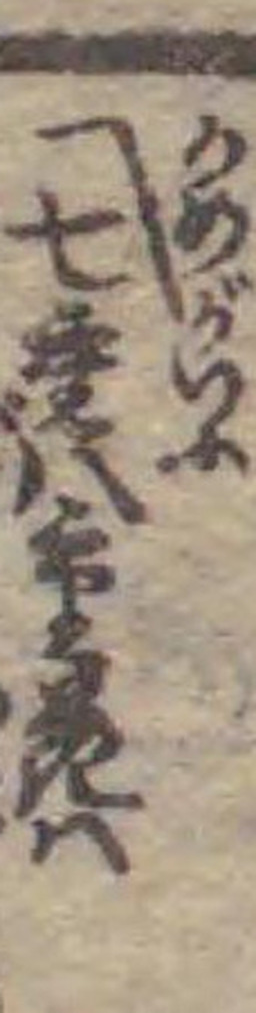〽七重八重花は
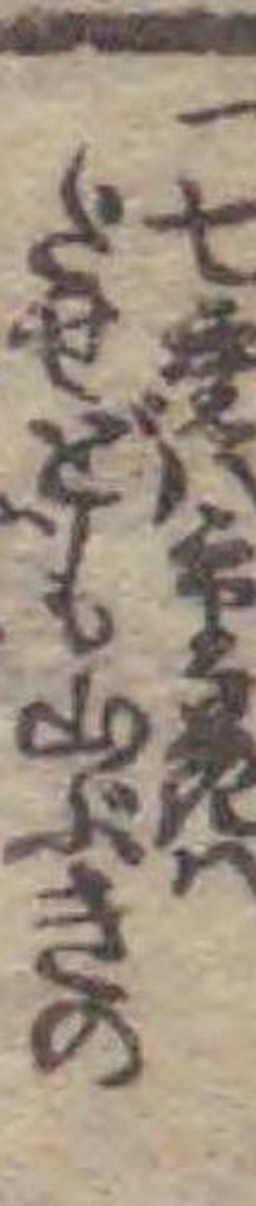だせども山ぶきの
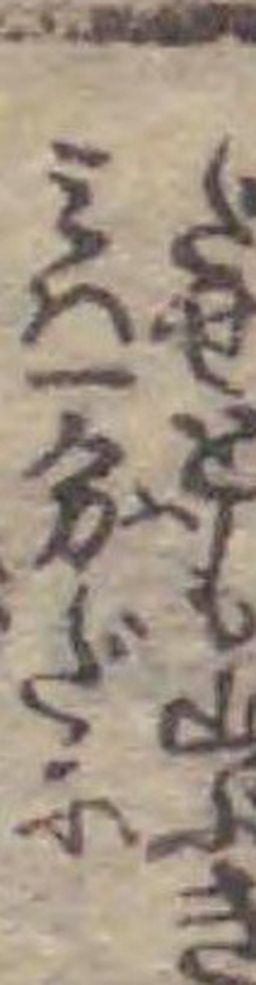みは一分だに
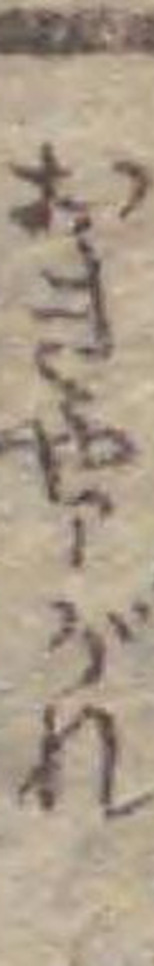おきやァがれ
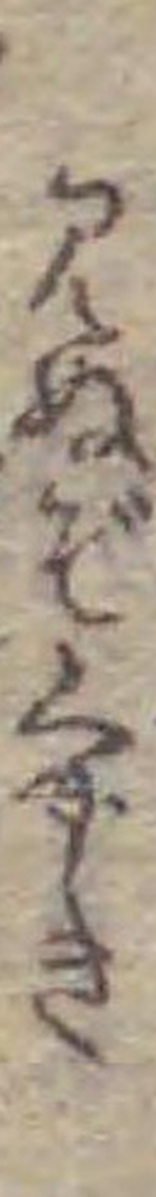見ぬぞくやしき
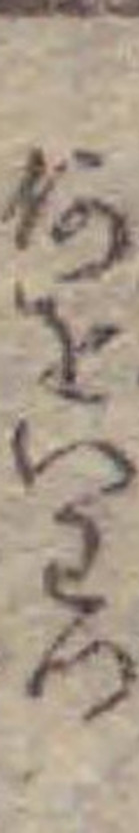何をいわつ
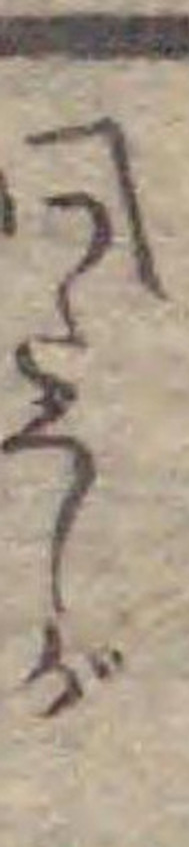〽わたくしが
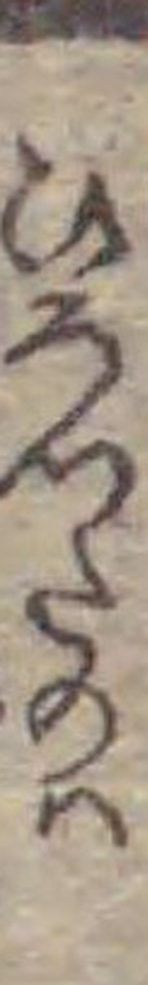ひろつたのは
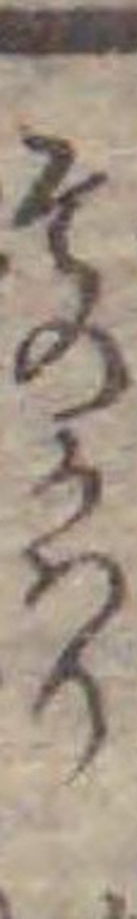そのかはり
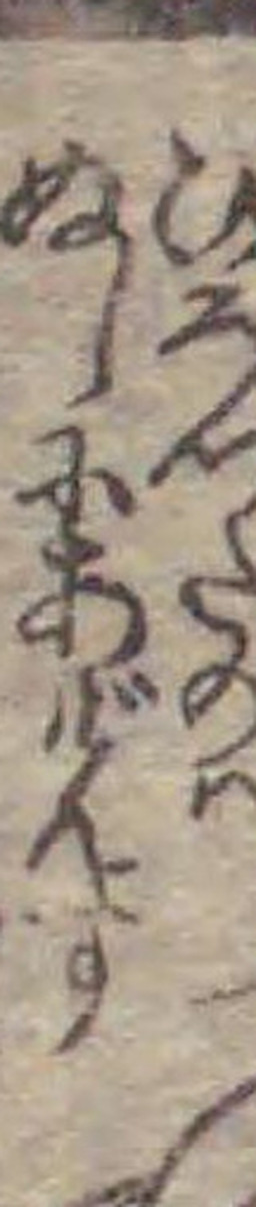ぬしにあげんす
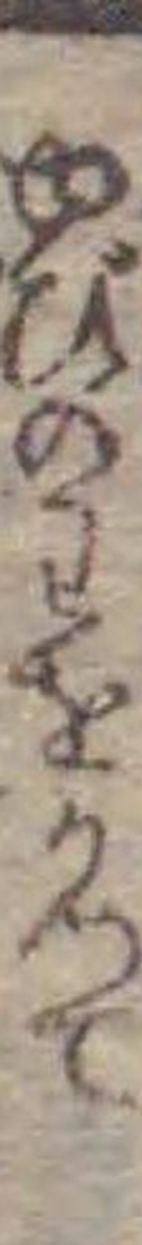ゆびのわをかつて

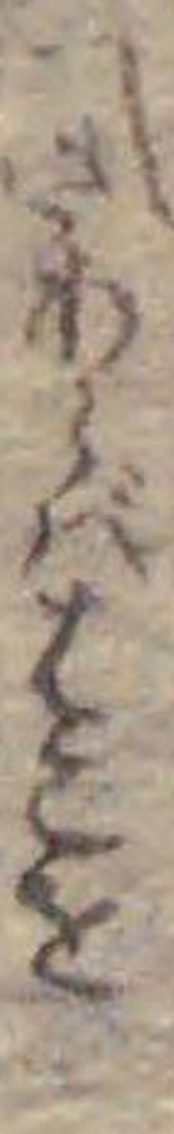〽さあらばはこを
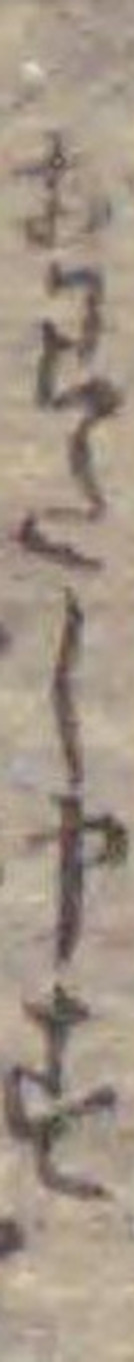おわたし申す
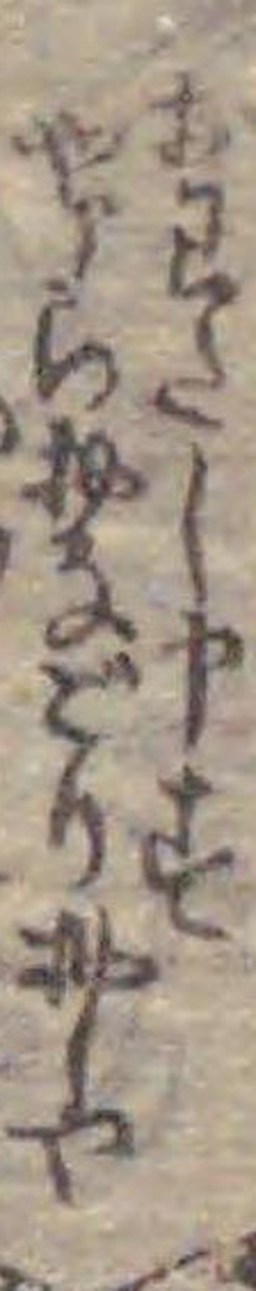やァらおなごりおしや
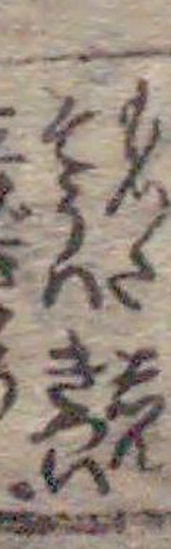そうはきつい
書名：竜宮苦界玉手箱 : 3巻
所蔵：国立国会図書館 National Diet Library, JAPAN
